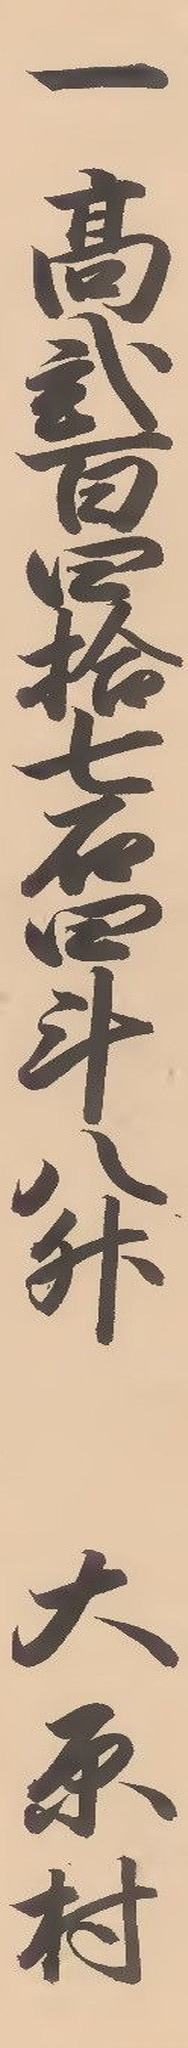一高弐百四拾七石四斗八升大原村
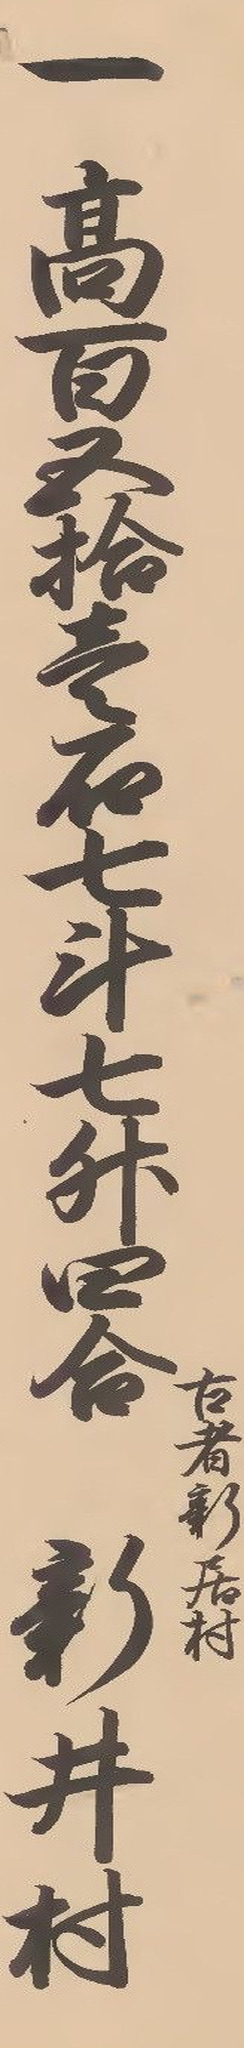一高百五拾壱石七斗七升四合新井村
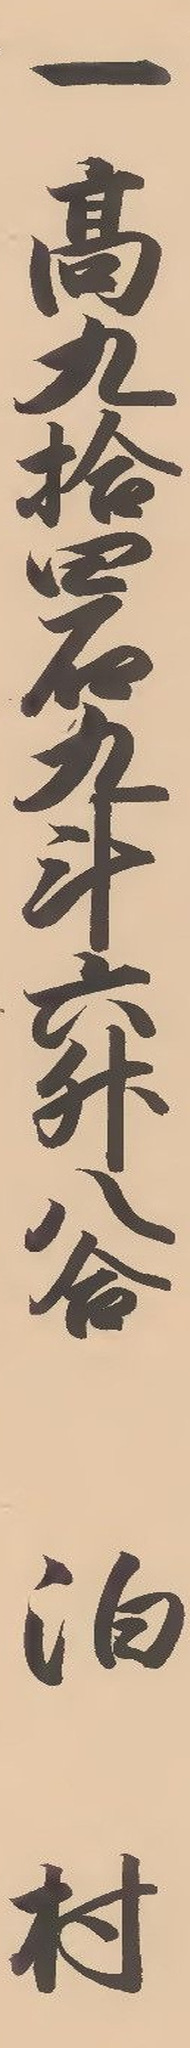一高九拾四石九斗六升八合泊村
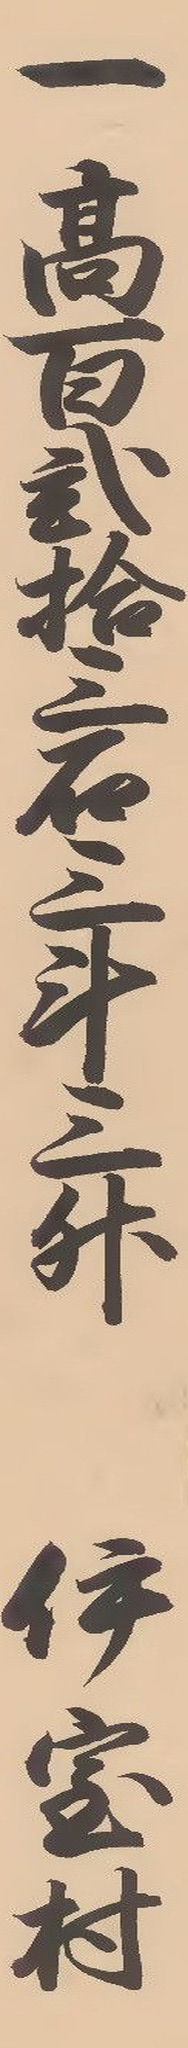一高百弐拾三石三斗三升伊室村
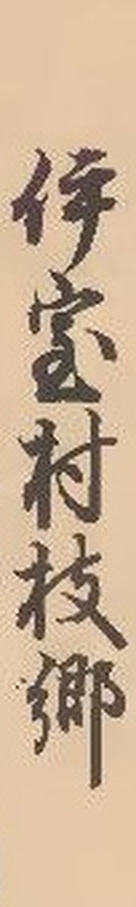伊室村枝郷
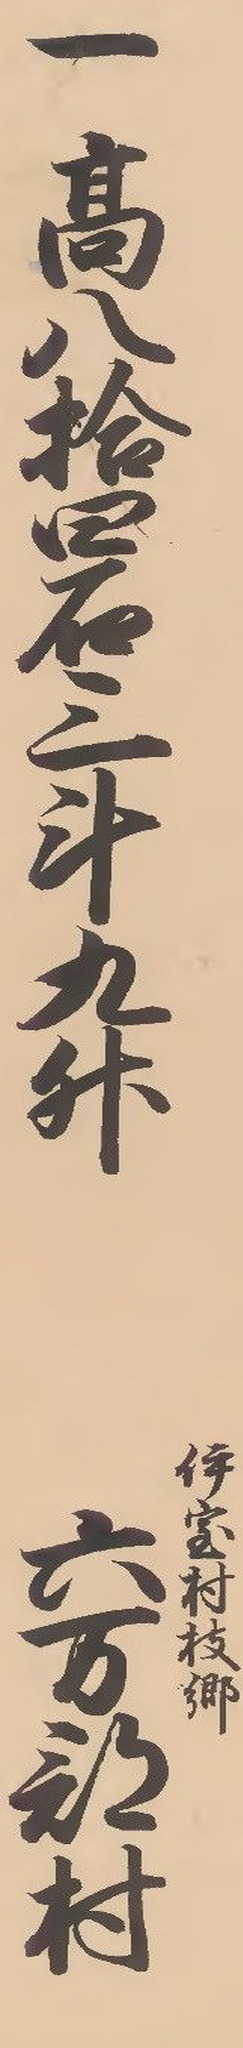一高八拾四石三斗九升六万部村

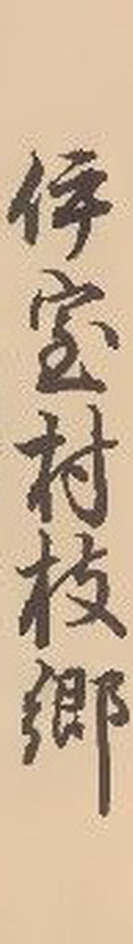伊室村枝郷
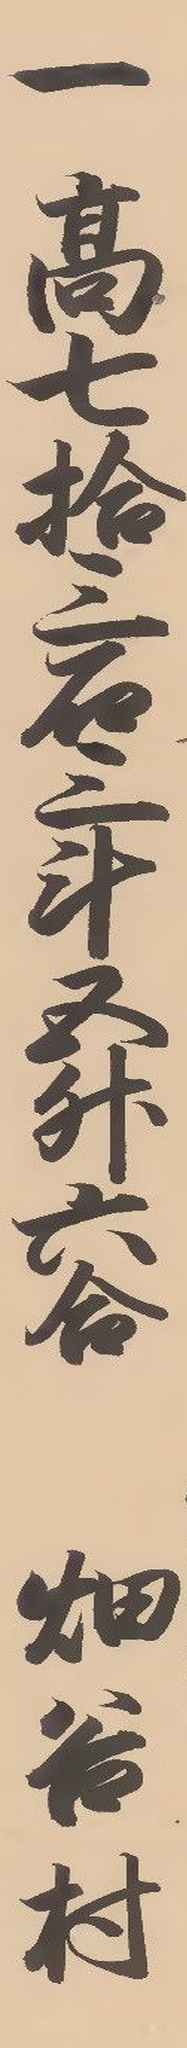一高七拾三石三斗五升六合畑谷村
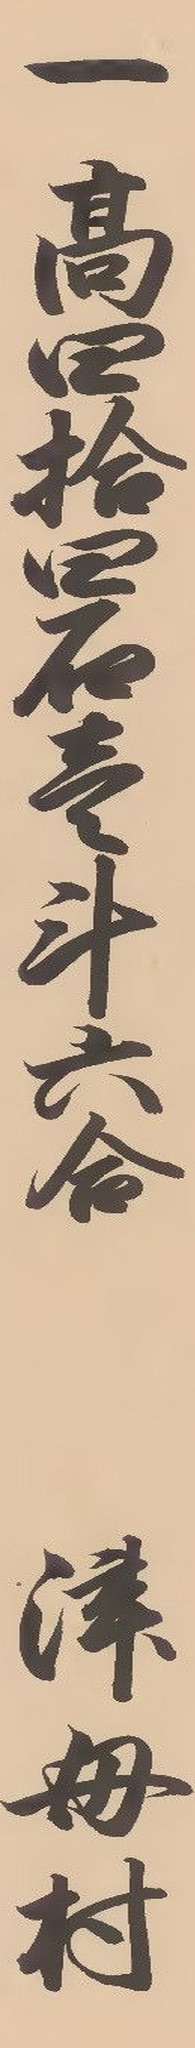一高四拾四石壱斗六合津母村
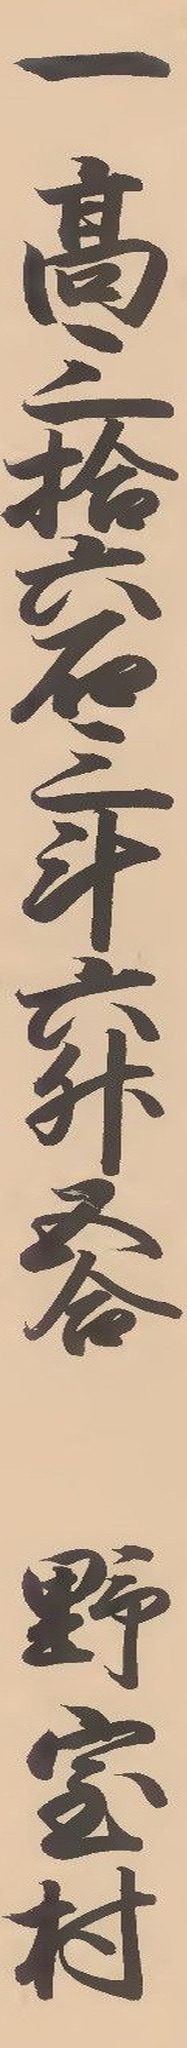一高三拾六石三斗六升五合野室村
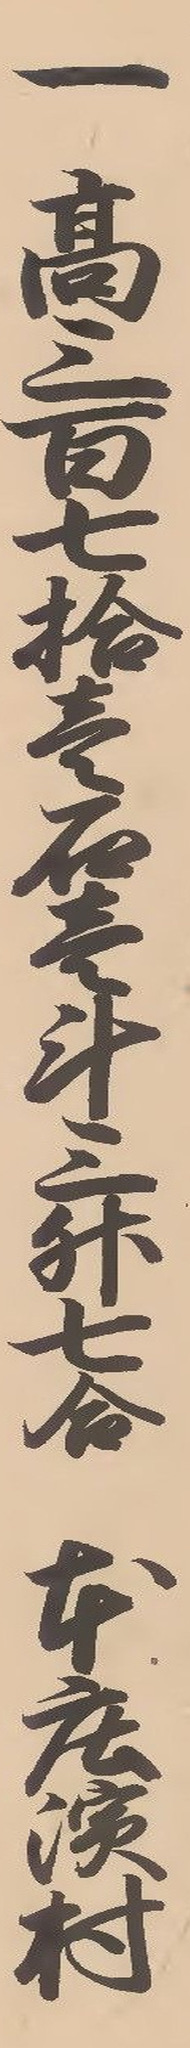一高三百七拾壱石壱斗三升七合本庄浜村
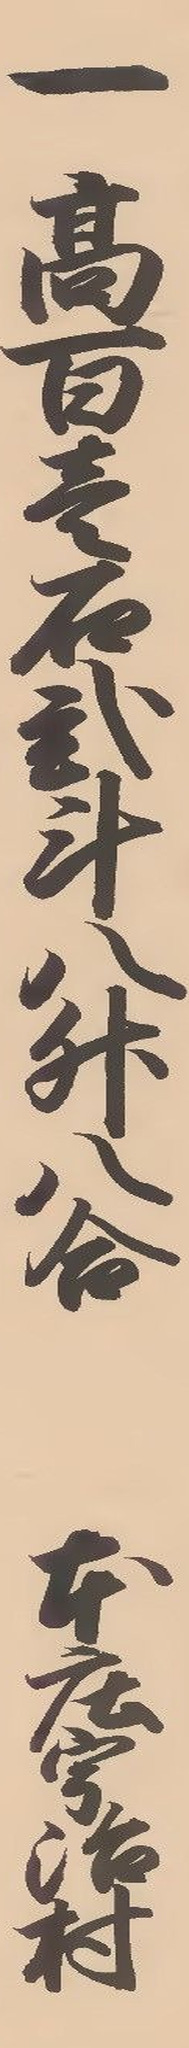一高百壱石弐斗八升八合本庄宇治村
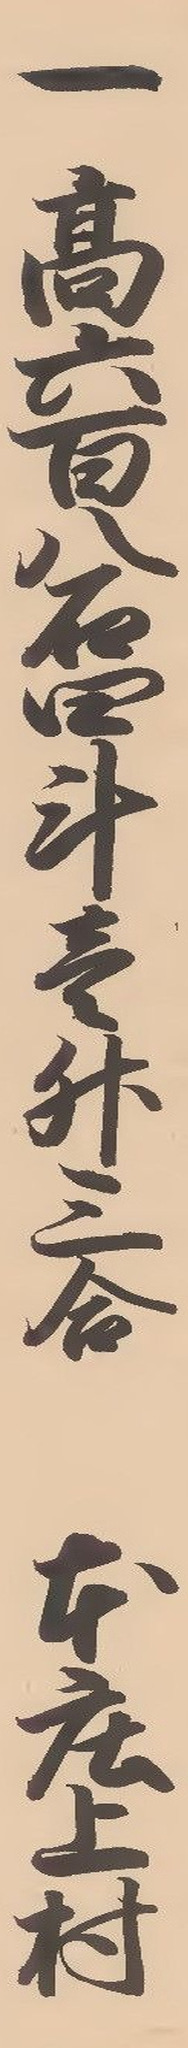一高六百八石四斗壱升三合本庄上村
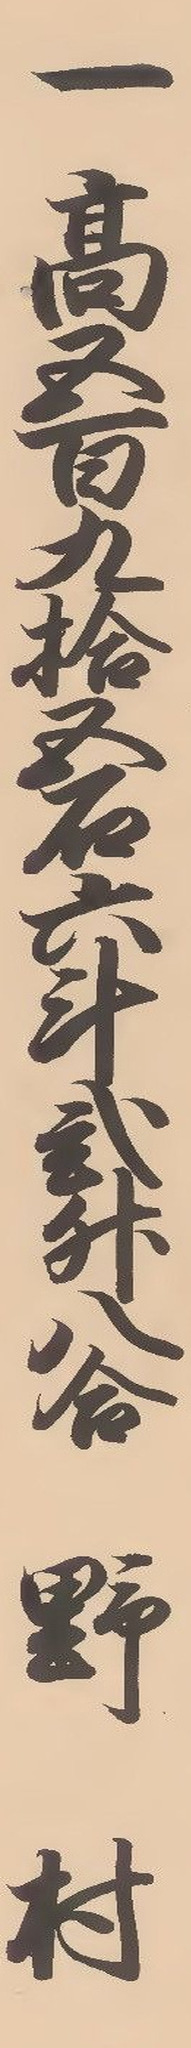一高五百九拾五石六斗弐升八合野村

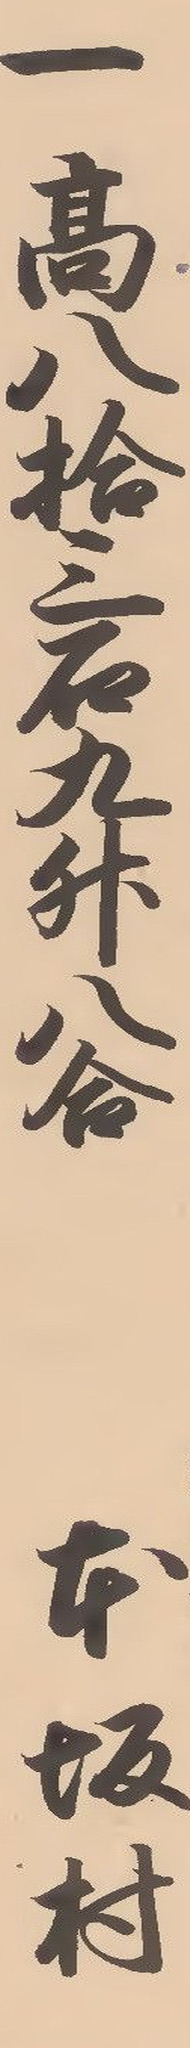一高八拾三石九升八合本坂村
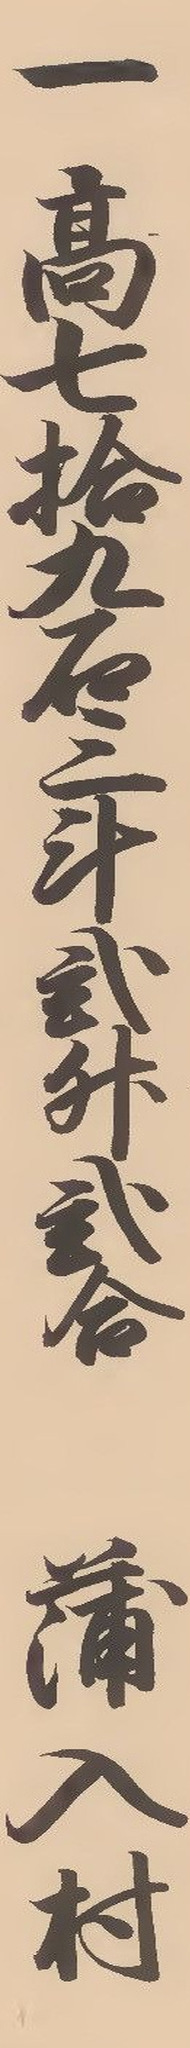一高七拾九石三斗弐升弐合蒲入村
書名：丹後国郷帳
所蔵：国立公文書館 National Archives of Japan
